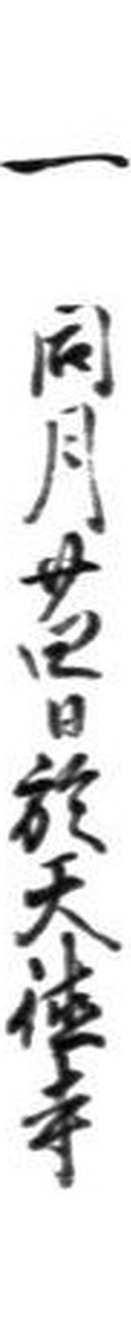一同月廿四日於天徳寺
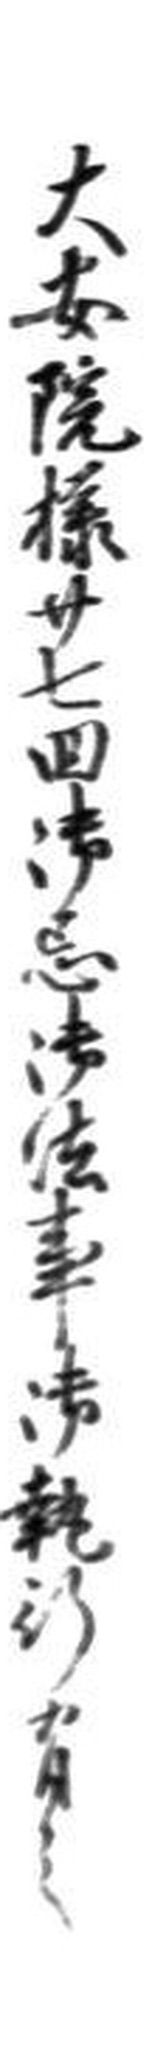大安院様廿七回御忌御法事御執行有之
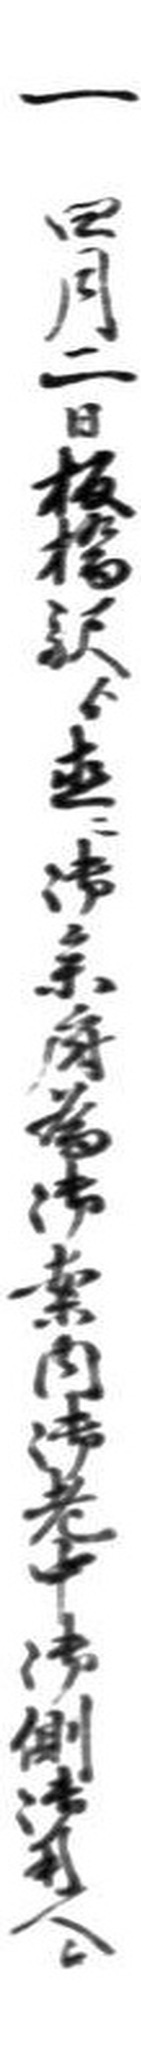一四月二日板橋駅ゟ直ニ御参府為御案内御老中御側御用人江
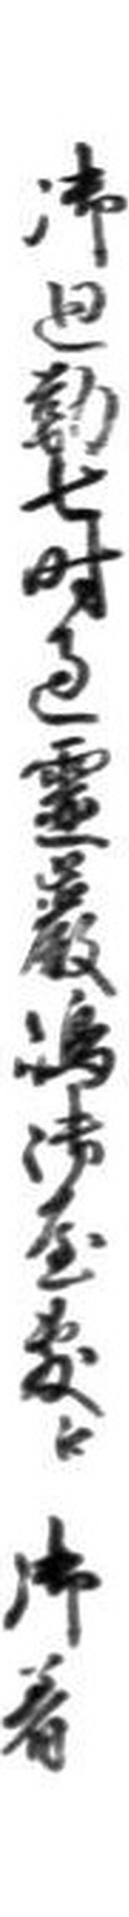御廻勤七時過霊巌嶋御屋敷江御着
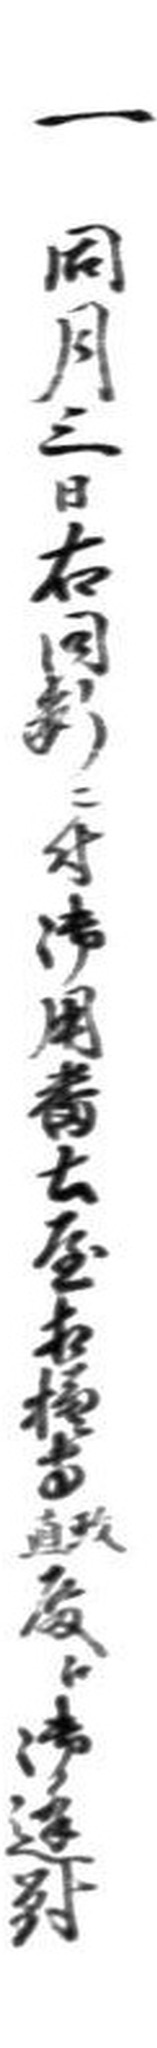一同月三日右同断ニ付御用番土屋相模守政直殿江御逢対
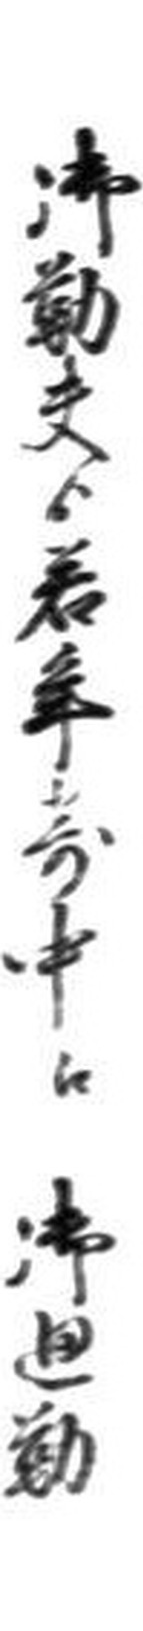御勤夫ゟ若年寄中江御廻勤
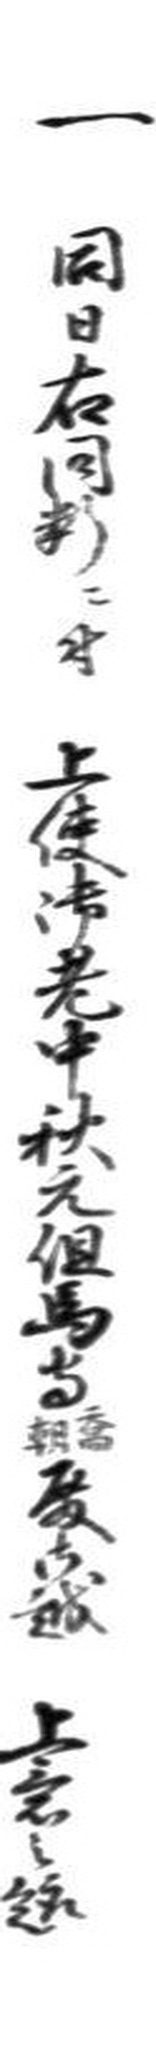一同日右同断ニ付上使御老中秋元但馬守喬朝殿御越上意之趣

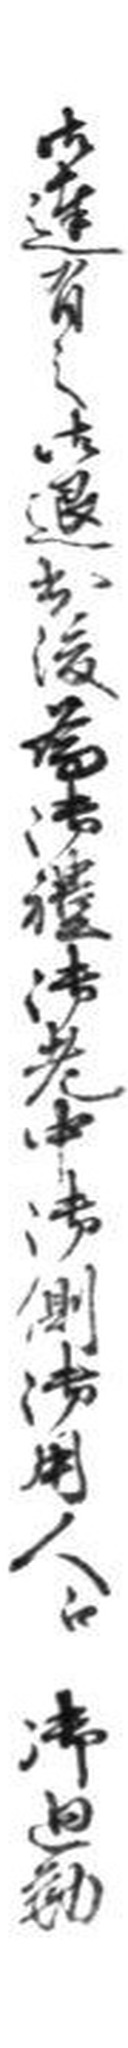御逢有之御退出後為御礼御老中御側御用人江御廻勤
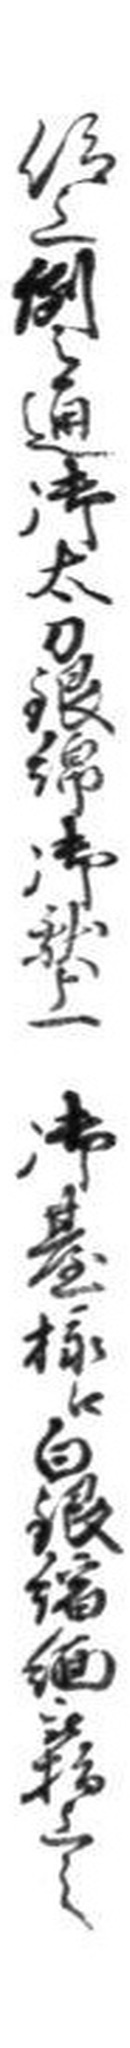仰上例之通御太刀銀綿御献上御臺様江白銀縮緬被指上之
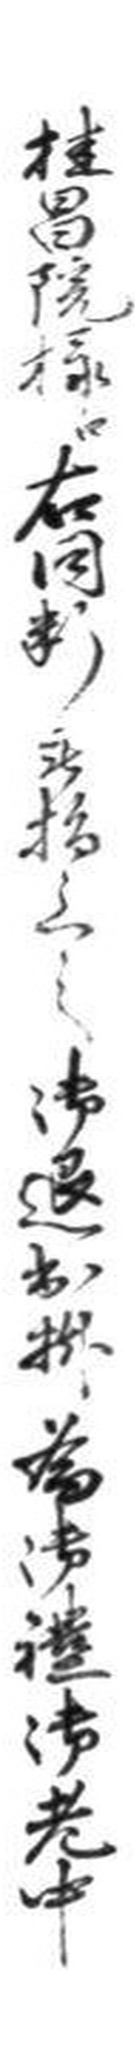桂昌院様江右同断被指上之御退出掛為御礼御老中
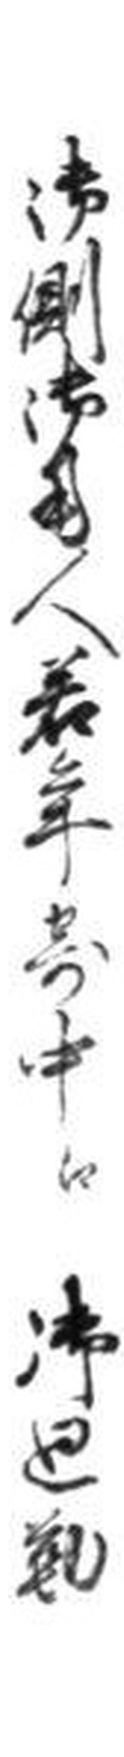御側御用人若年寄中江御廻勤
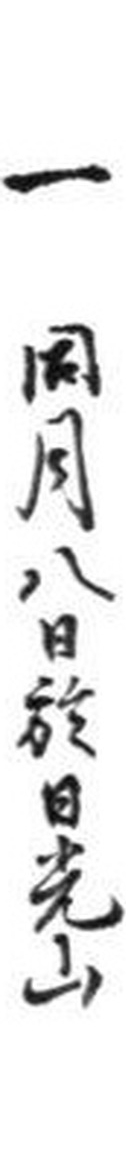一同月八日於日光山
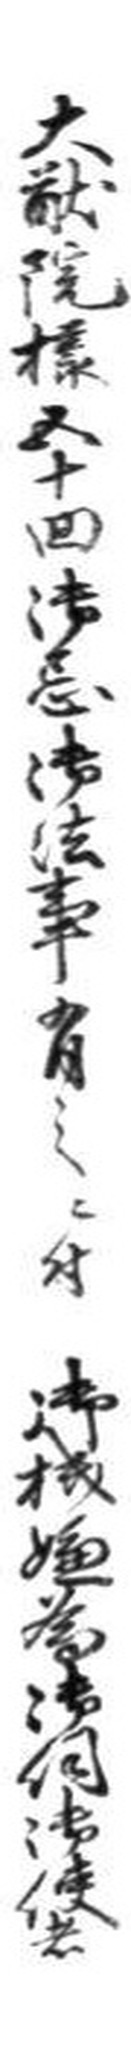大猷院様五十回御忌御法事有之ニ付御機嫌為御伺御使者
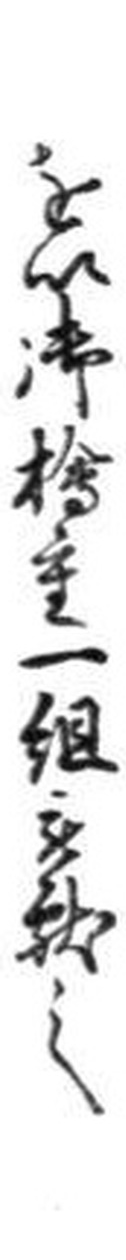を以御桧重一組被献之
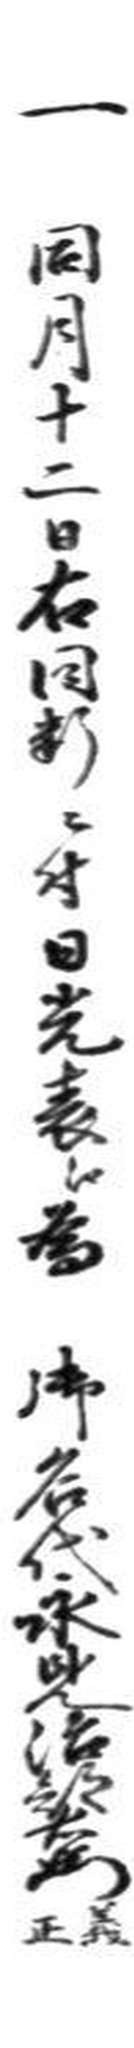一同月十二日右同断ニ付日光表江為御名代永見治部右衛門義正
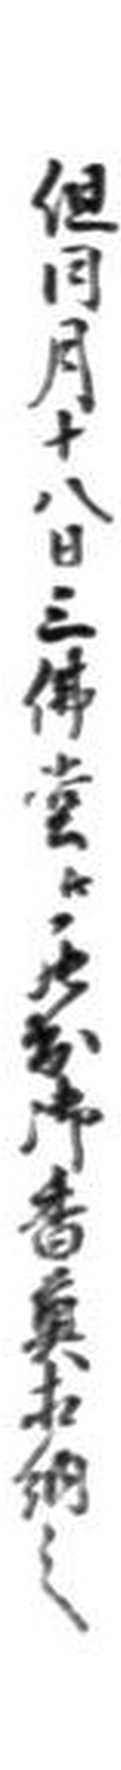但同月十八日三仏堂江罷出御香奠相納之
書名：家譜 二十一 吉品公 従元禄十三年到同十四年
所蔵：福井県文書館 Fukui Prefectural Archives
